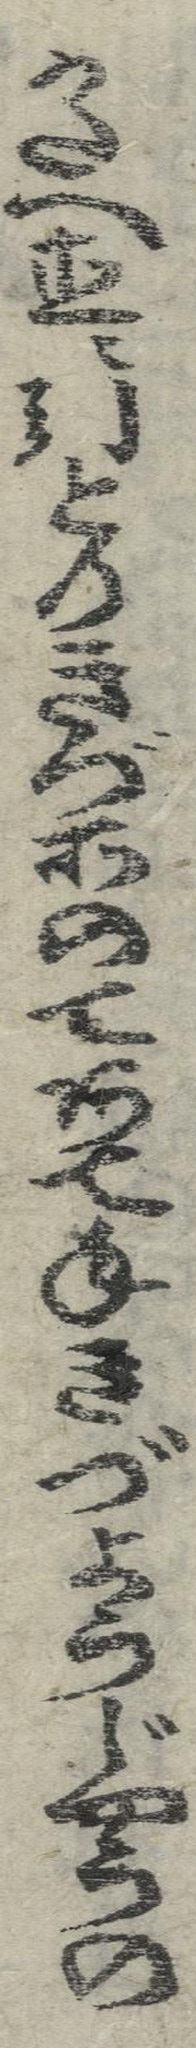かたへ直に引とりきづ所のてあて手きづようじやうの
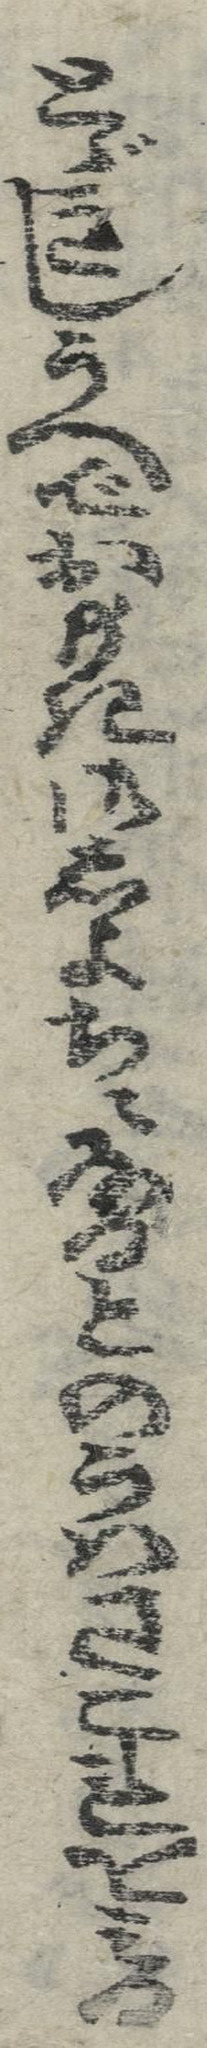とゞきしうへでおもき御しよちになるとのうはさこれをみる
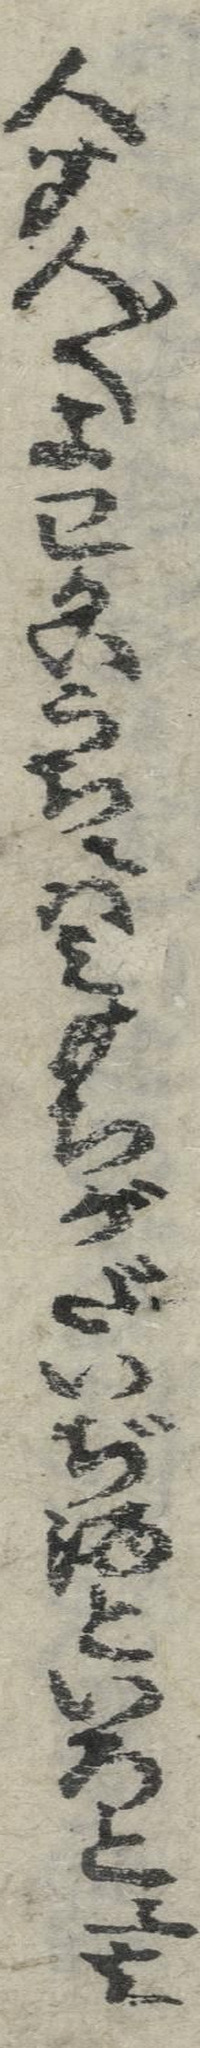人聞人〳〵よわかいうちにはみもちがだいぢ酒といろとに其
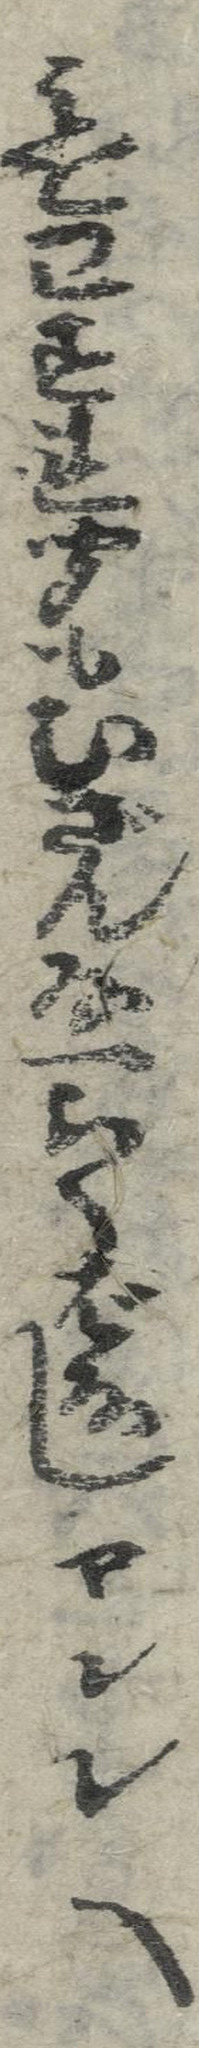みをわすれ聞もむざんな一らくばなしアンレへ
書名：奥州すじ大つなみおおあれくどき
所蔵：東京大学地震研究所図書室 Earthquake Research Institute Library, The University of Tokyo, JAPAN
